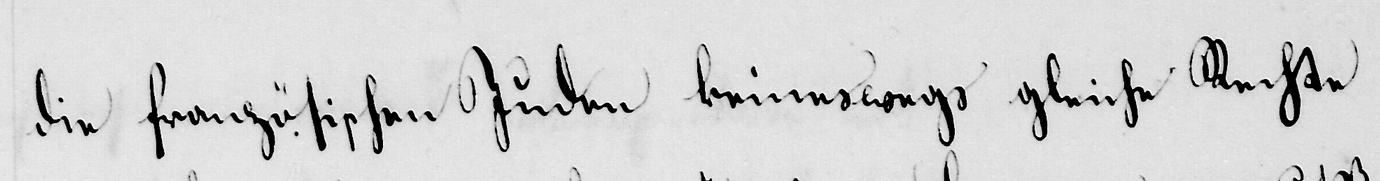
die französischen Juden keineswegs gleiche Rechte
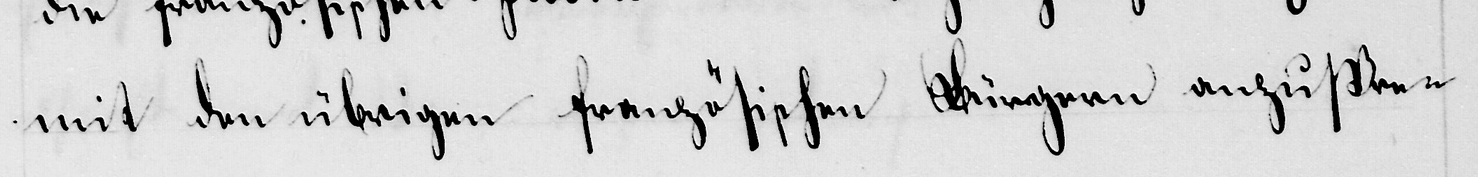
mit den übrigen französischen Bürgern anzuspre¬
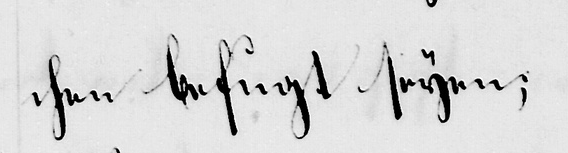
chen befugt seyen;
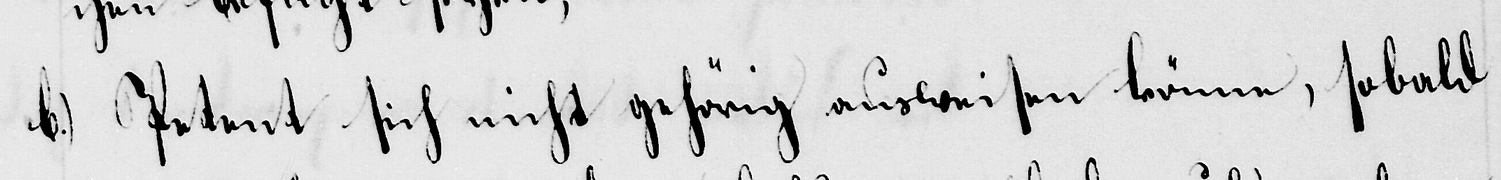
b.) Petent sich nicht gehörig ausweisen könne, sobald
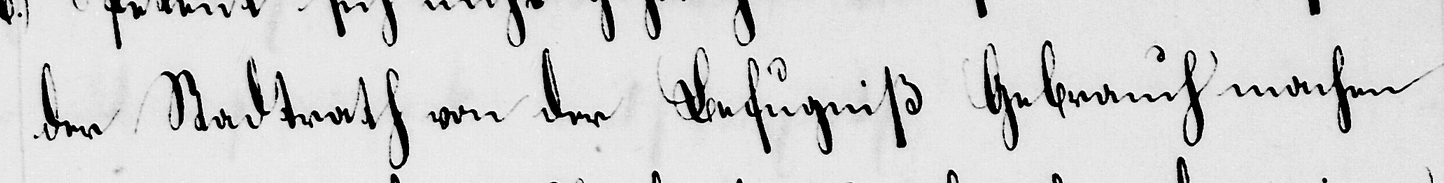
der Stadtrath von der Befugniß Gebrauch machen
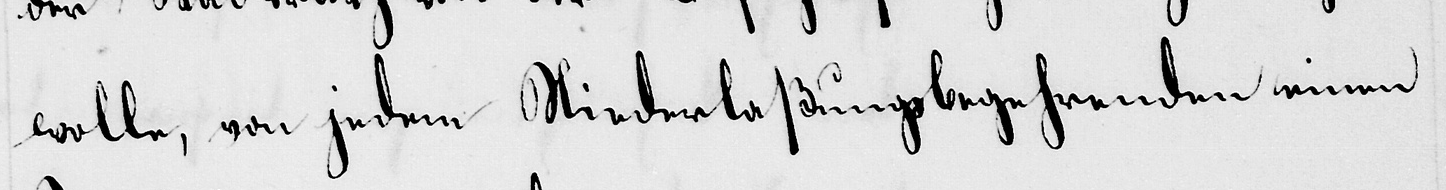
wolle, von jedem Niederlaßungsbegehrenden einen
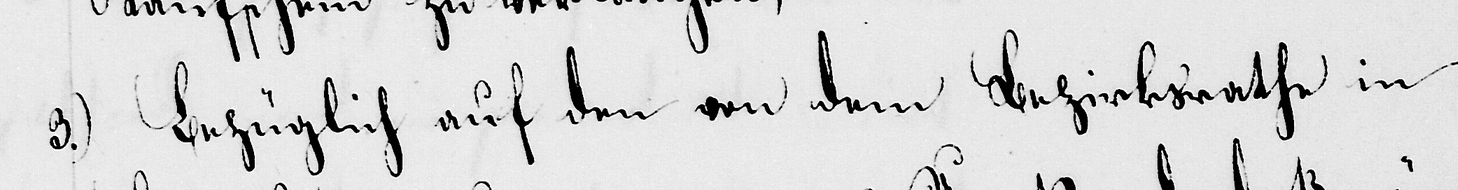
3.) bezüglich auf den von dem Bezirksrathe in
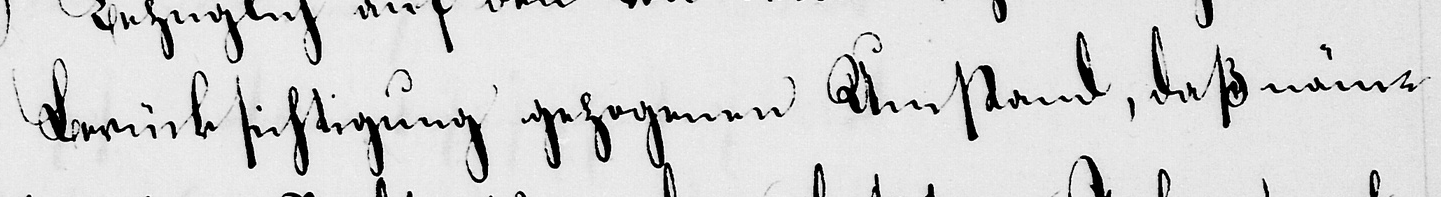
Berücksichtigung gezogenen Umstand, daß näm¬
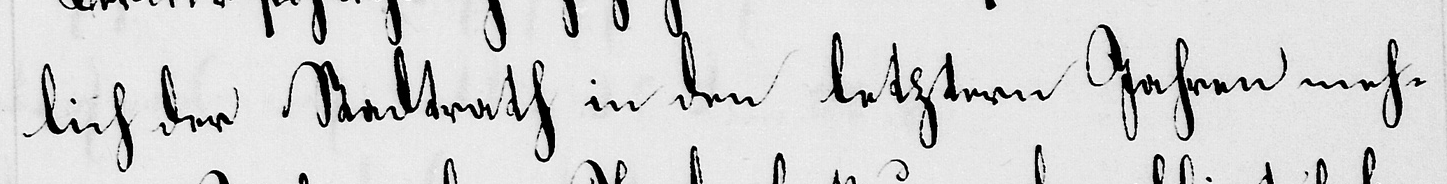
lich der Stadtrath in den letztern Jahren meh¬
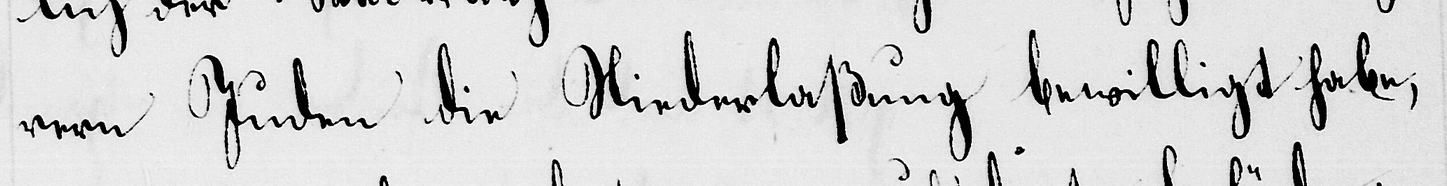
rern Juden die Niederlaßung bewilligt habe,
